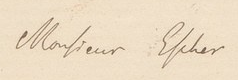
Monsieur Escher
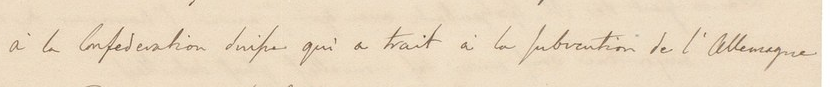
à la Confederation Suisse qui a trait à la subvention de l'Allemagne
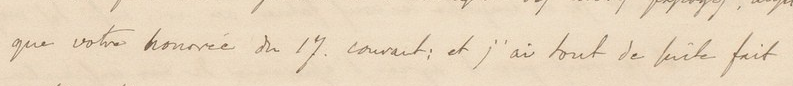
que votre honorée du 17. courant: et j'ai tout de suite fait
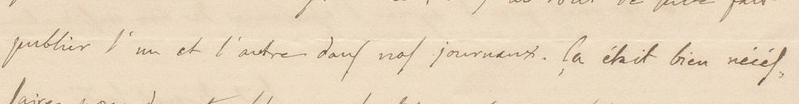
publier l'un et l'autre dans nos journaux. Ça était bien nécés -
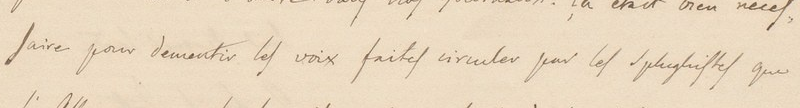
saire pour dementir les voix faites circuler par les Splughistes que
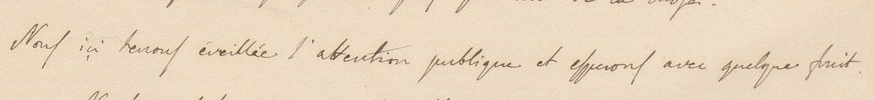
Nous ici tenons éveillée l'attention publique et esperons avec quelque fruit.
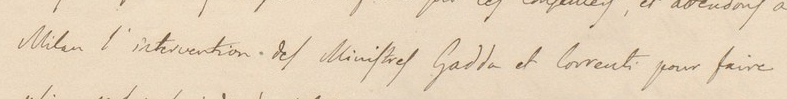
Milan l'intervention des Ministres Gadda et Correnti pour faire
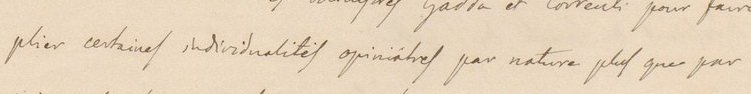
plier certaines individualités opiniâtres par nature plus que par
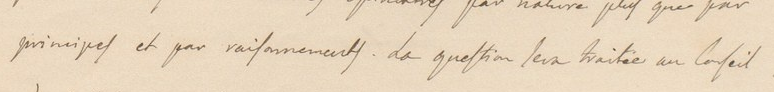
principes et par raisonnements. La question sera traitée au Conseil
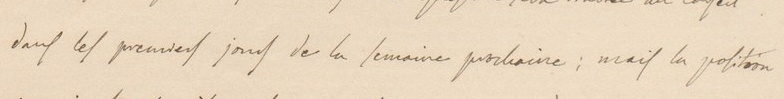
dans les premiers jours de la semaine prochaine; mais la position
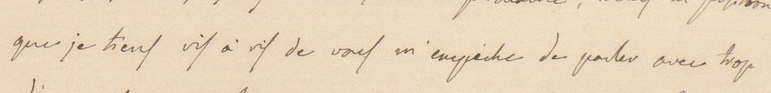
que je tiens vis à vis de vous m'empéche de parler avec trop
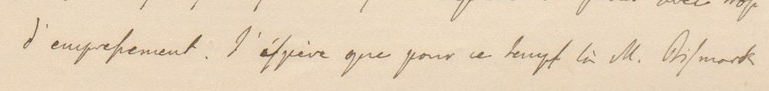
d`empressement. J'éspère que pour ce temps là M. Bismarck
